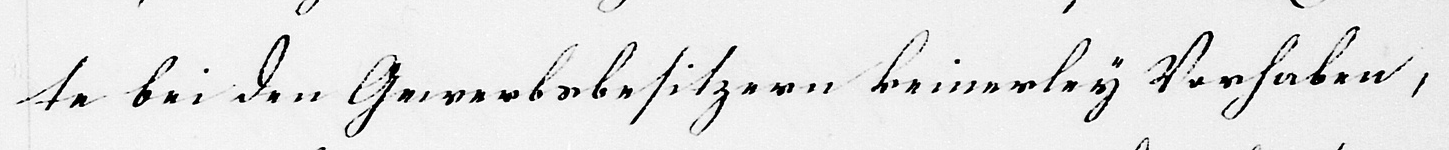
te bei den Gewerbsbesitzern keinerley Vorhaben,
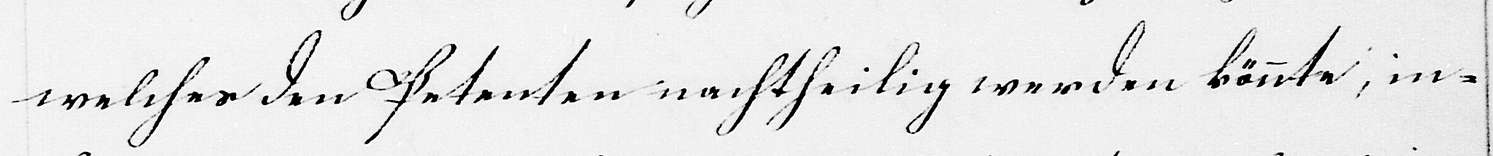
welches den Petenten nachtheilig werden könnte, in¬
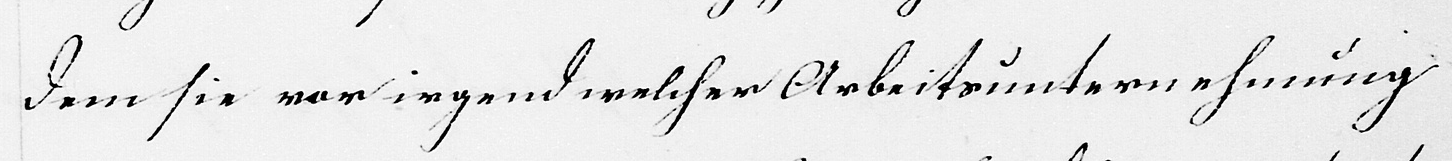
dem sie vor irgend welcher Arbeitsunternehmung
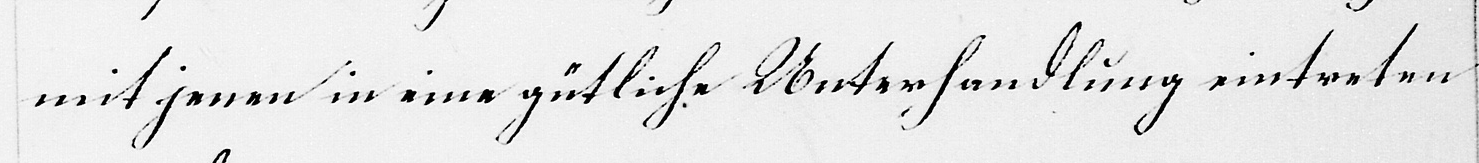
mit jenen in eine gütliche Unterhandlung eintreten
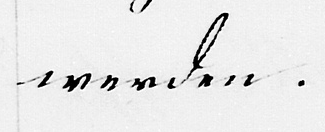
werden.
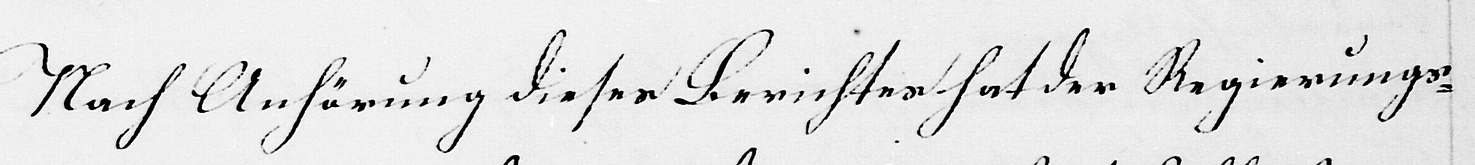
Nach Anhörung dieses Berichtes hat der Regierungs¬
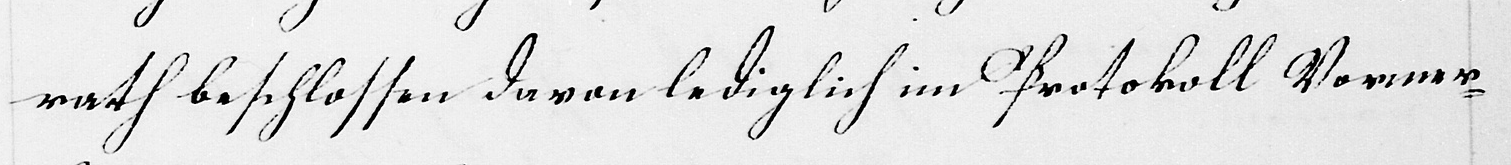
rath beschlossen davon lediglich im Protokoll Vormer¬
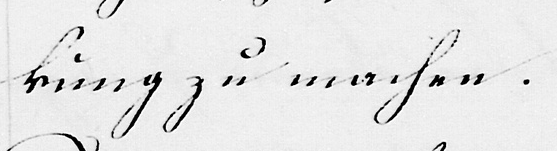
kung zu machen.
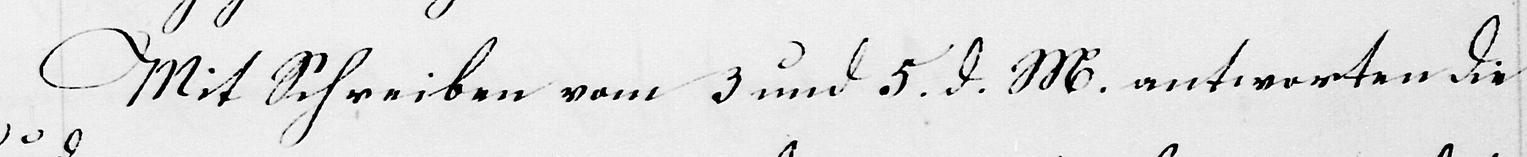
Mit Schreiben vom 3 und 5. d. M. antworten die
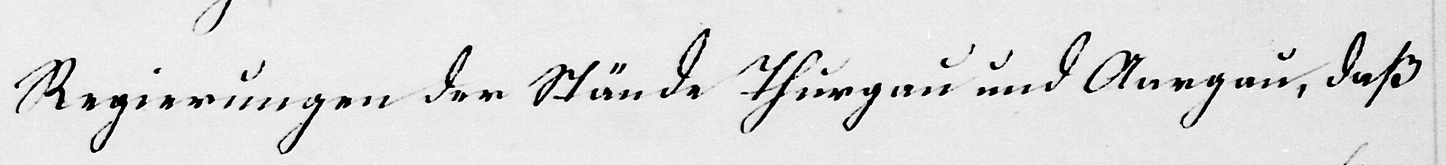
Regierungen der Stände Thurgau und Aargau, daß
